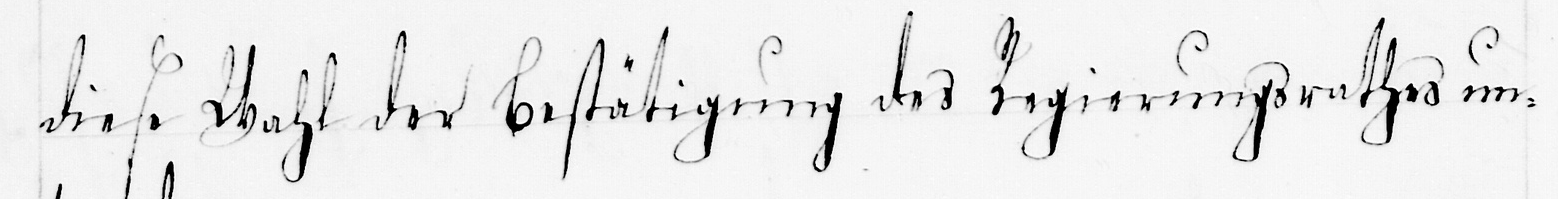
diese Wahl der Bestätigung des Regierungsrathes un¬
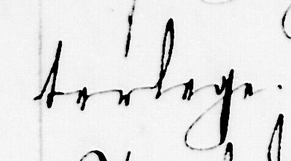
terlege.
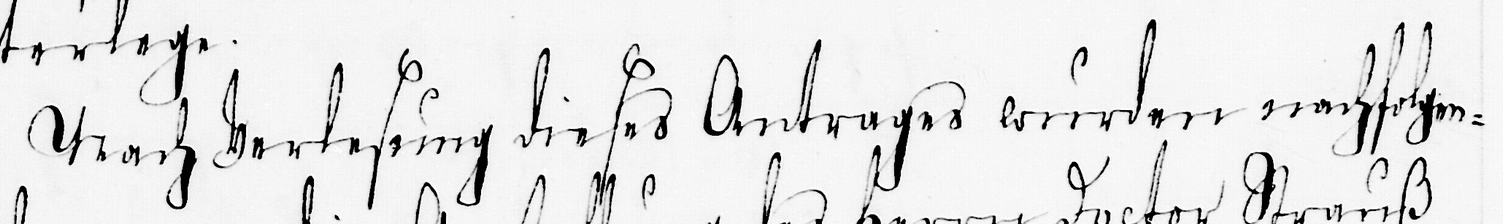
Nach Verlesung dieses Antrages wurden nachfolge¬
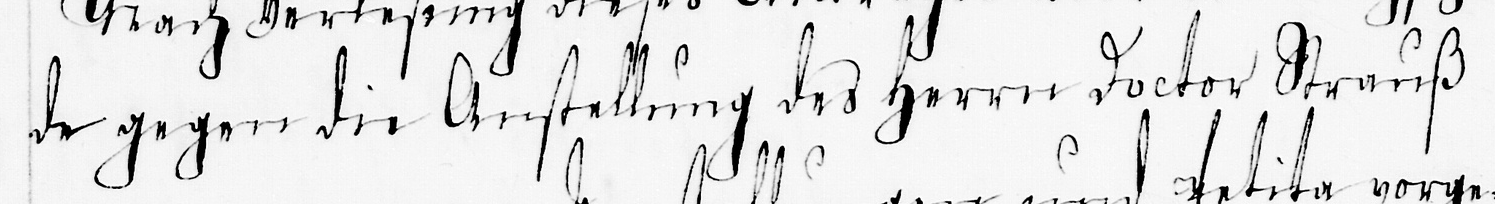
nde gegen die Anstellung des Herrn Doctor Strauß
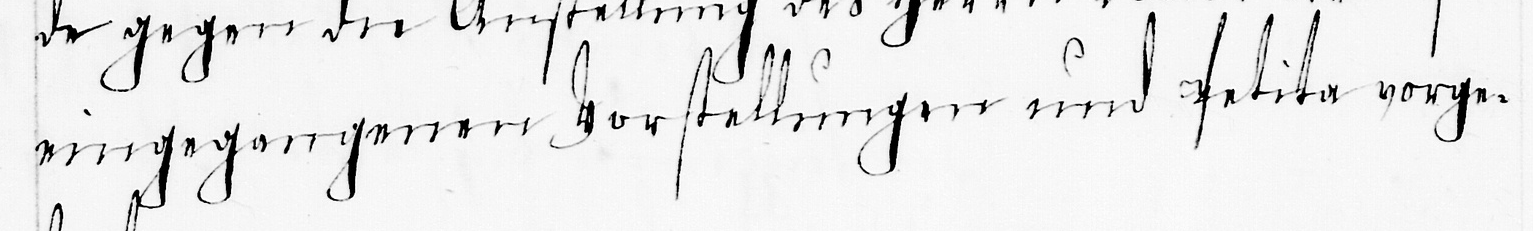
eingegangenen Vorstellungen und Petita vorge¬
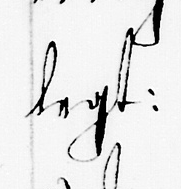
legt:
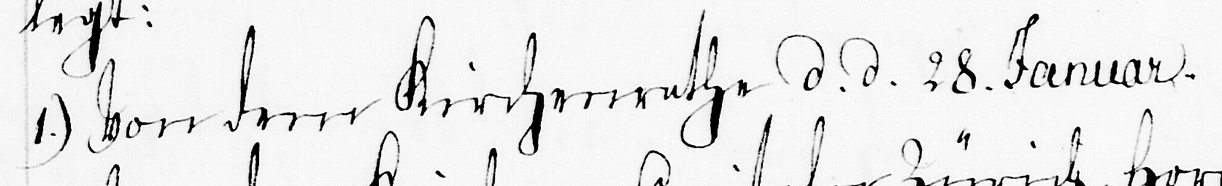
1.) Von dem Kirchenrathe d. d. 28. Januar.
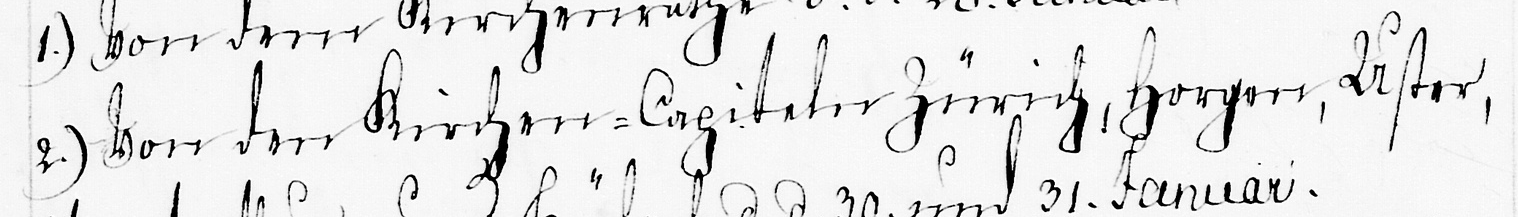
2.) Von den Kirchen-Capiteln Zürich, Horgen, Uster,
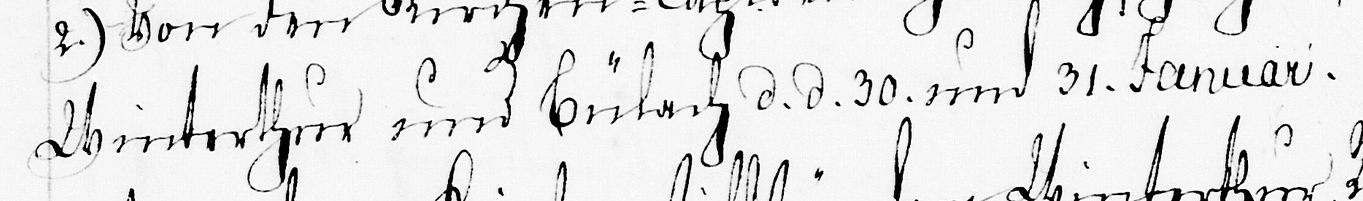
Winterthur und Bülach d. d. 30. und 31. Januar.
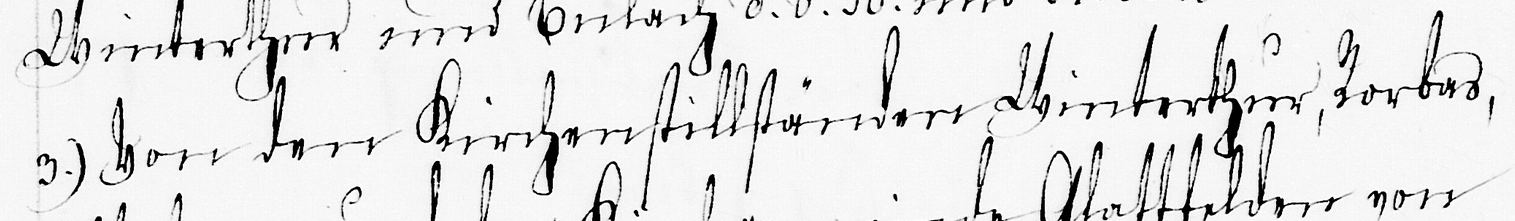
3.) Von den Kirchenstillständen Winterthur, Rorbas,
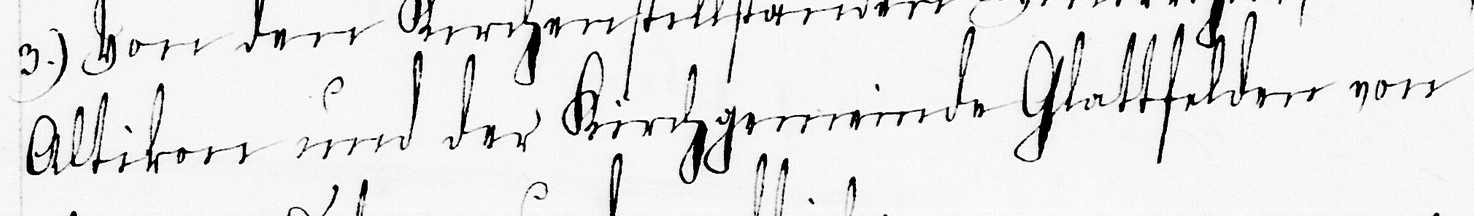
Altikon und der Kirchgemeinde Glattfelden von
